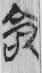命
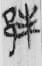邦
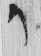人
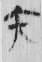內
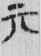亓（其）
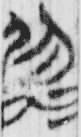溺
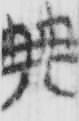典
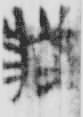戕
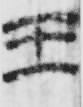王
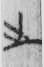之
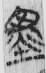墨
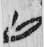㠯（以）
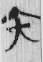內
